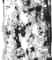正
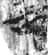𠁩
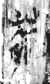萩（秋）
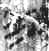三
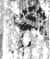月
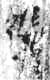{尸拃}（作）
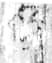高
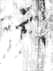凥（居）
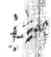於
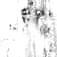西
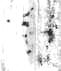○（得）
